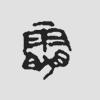{雨䀠勹}
